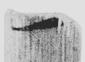㠯
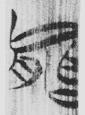能
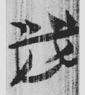戔（賤）
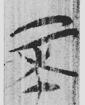不
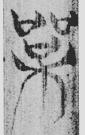喿（肖）
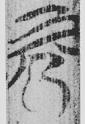而
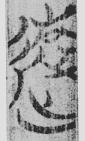遠
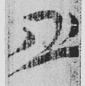之
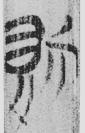則
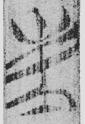民
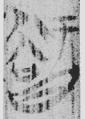智（知）
